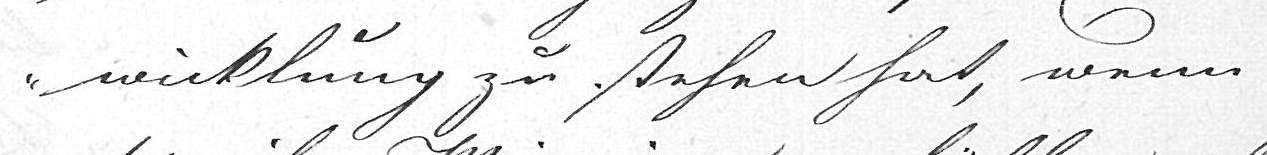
" wicklung zu stehen hat, wenn
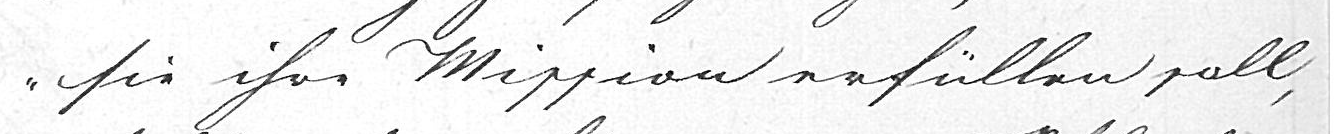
" sie ihre Mission erfüllen soll,
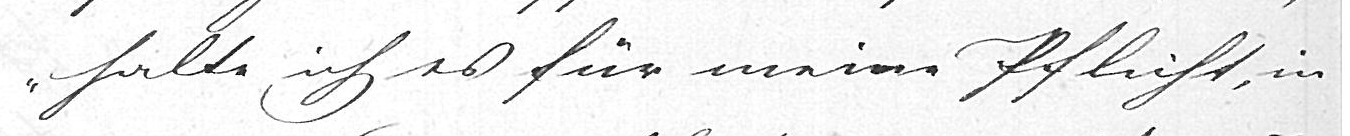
" halte ich es für meine Pflicht, in
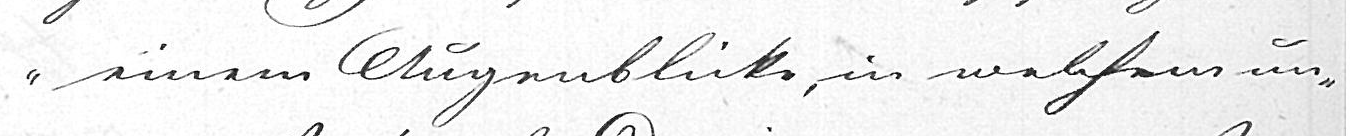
" einem Augenklicke, in welchem un-
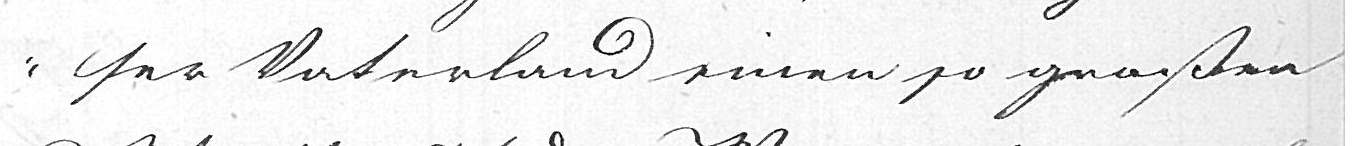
" ser Vaterland einen so großen
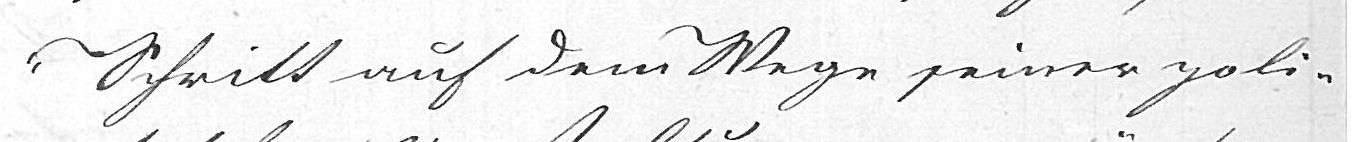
" Schritt auf dem Wege seiner poli-
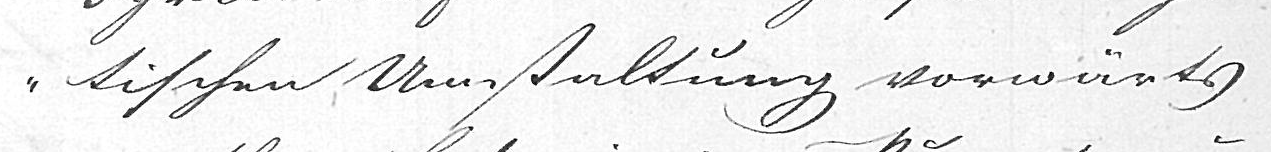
" tischen Umstellung vorwärts
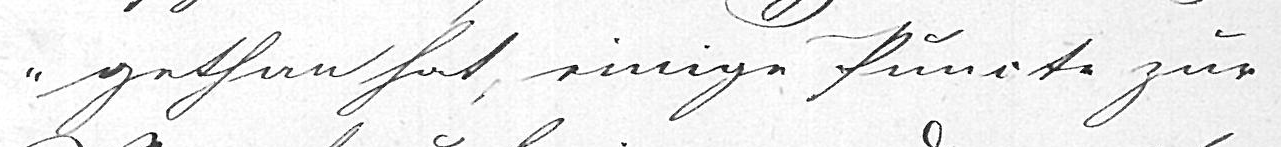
" gethan hat, einige Puncte zur
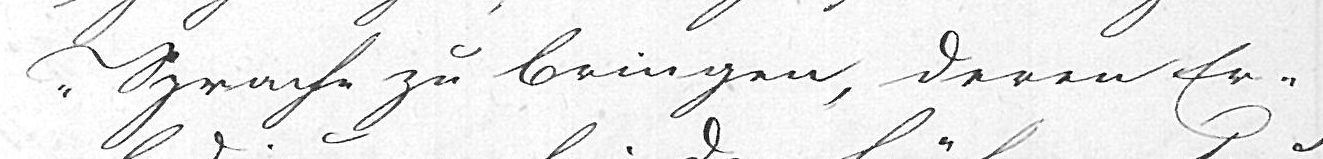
" Sprache zu bringen, deren Er-
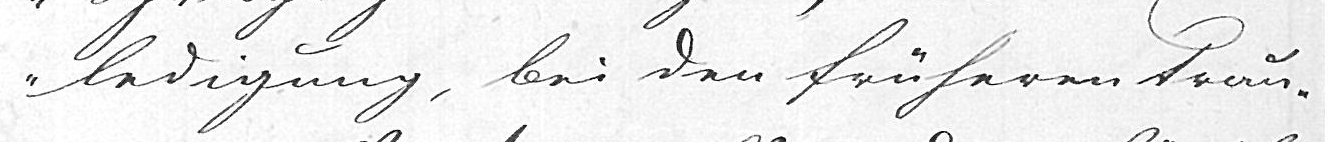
" ledigung, bei den früheren trau-
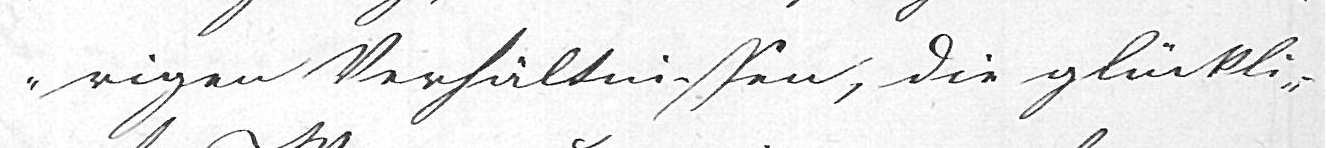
" rigen Verhältnissen, die glückli-
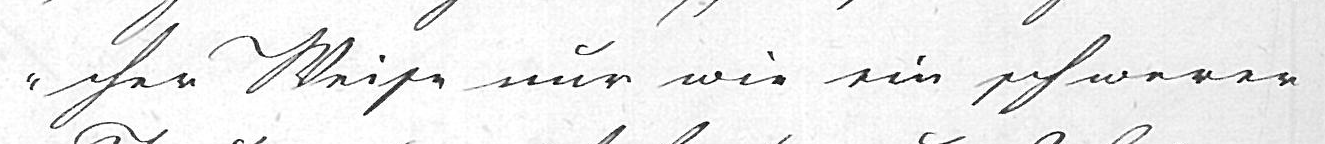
" cher Weise nur wie ein schwerer
